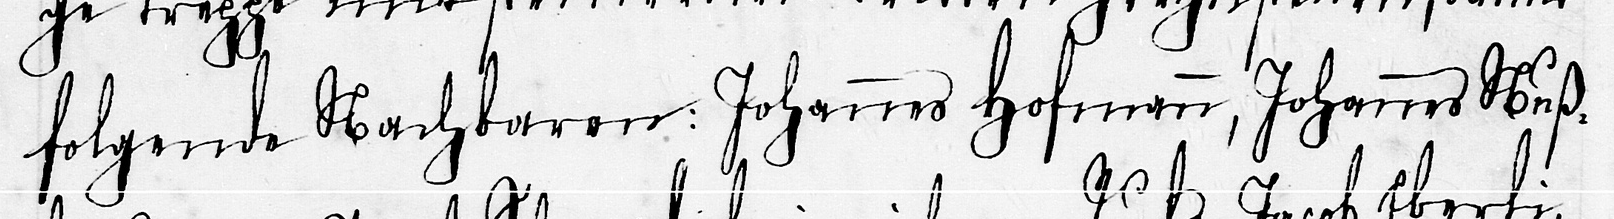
folgende Nachbaren: Johannes Hofmann, Johannes Nuß¬
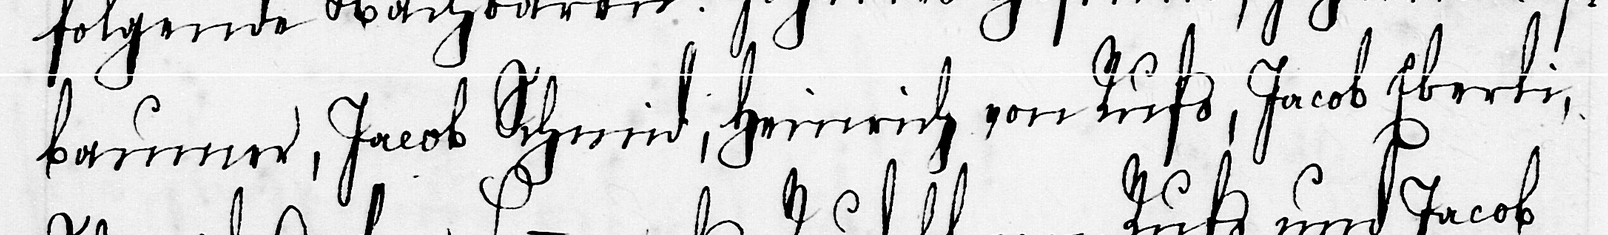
baumer, Jacob Schmid, Heinrich von Rufs, Jacob Eberli,
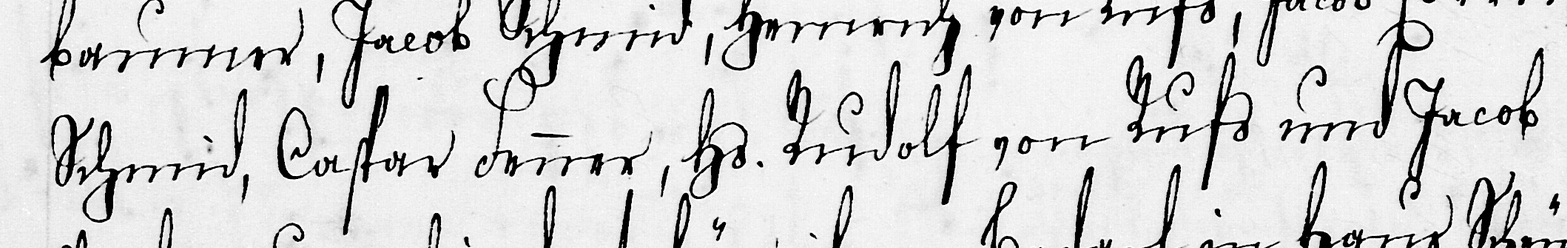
Schmid, Caspar Fenner, Hs. Rudolf von Rufs und Jacob
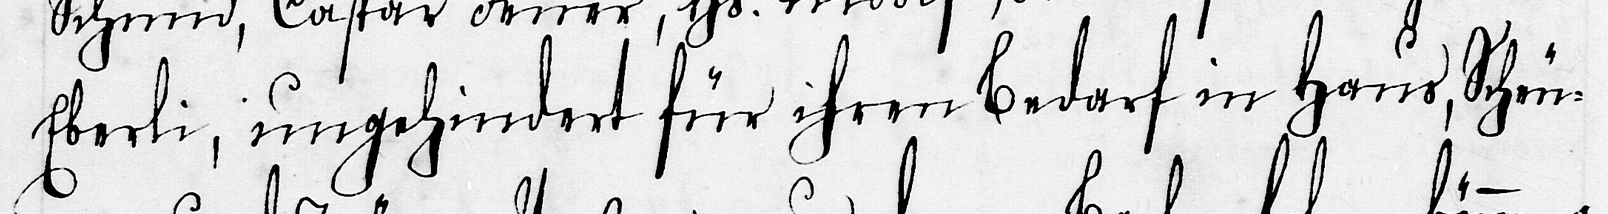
Eberli, ungehindert für ihren Bedarf in Haus, Scheu¬
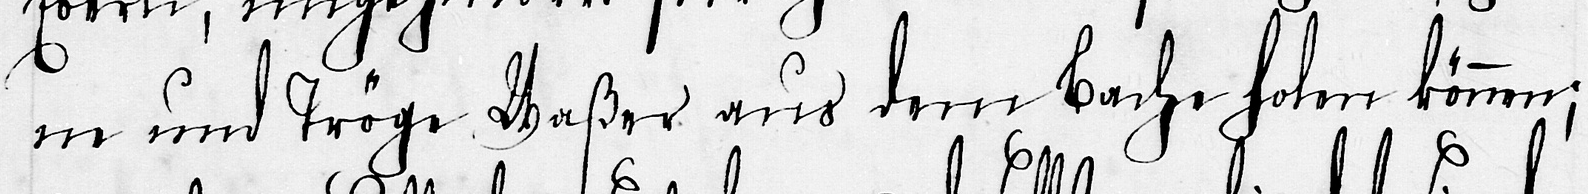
ne und Tröge Waßer aus dem Bache holen können;
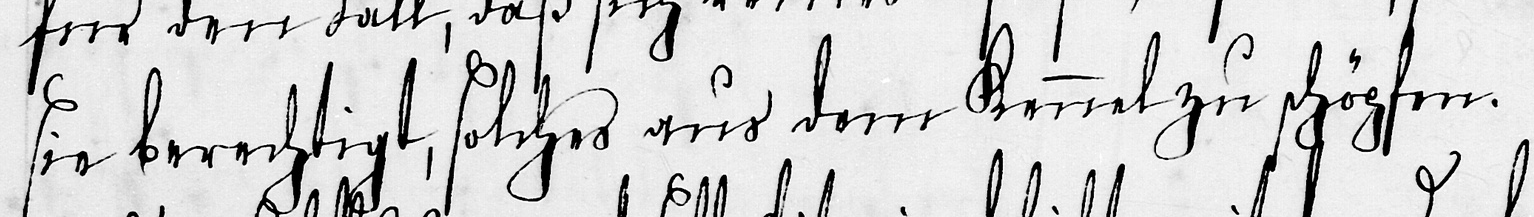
sie berechtigt, solches aus dem Kennel zu schöpfen.
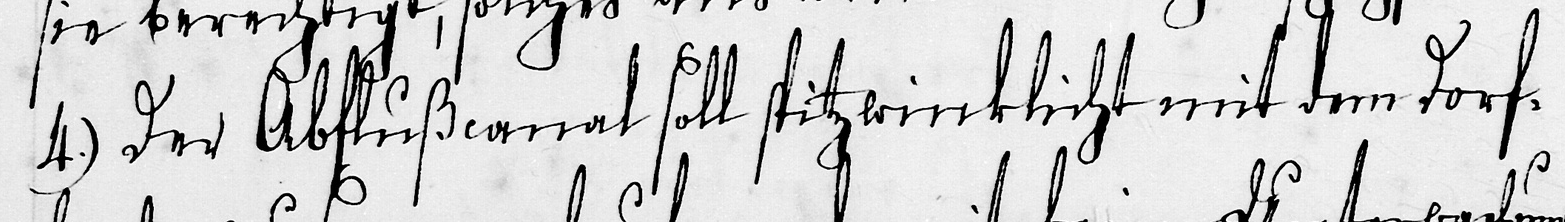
4.) Der Abflußcanal soll spitzwinklicht mit dem Dorf¬
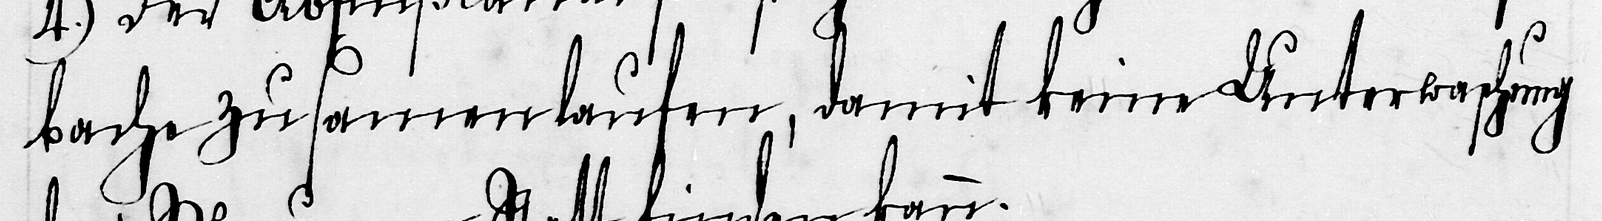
bache zusamenlaufen, damit keine Unterwaschung
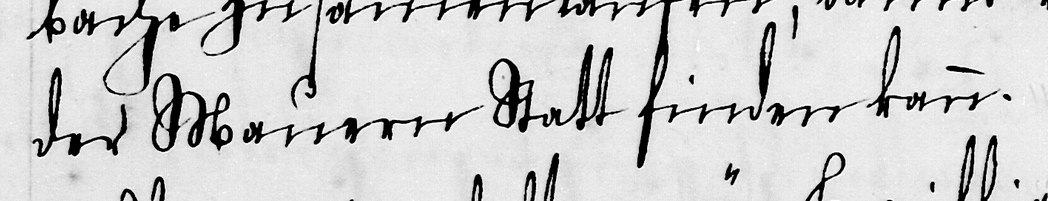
der Mauern Statt finden kann.
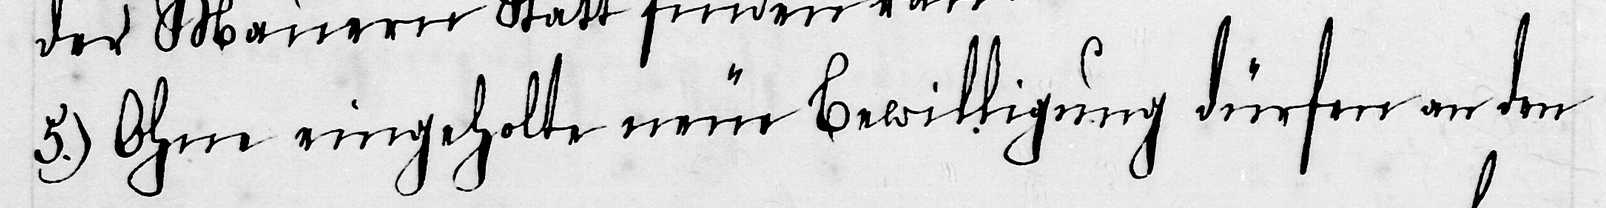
5.) Ohne eingeholte neue Bewilligung dürfen an den
